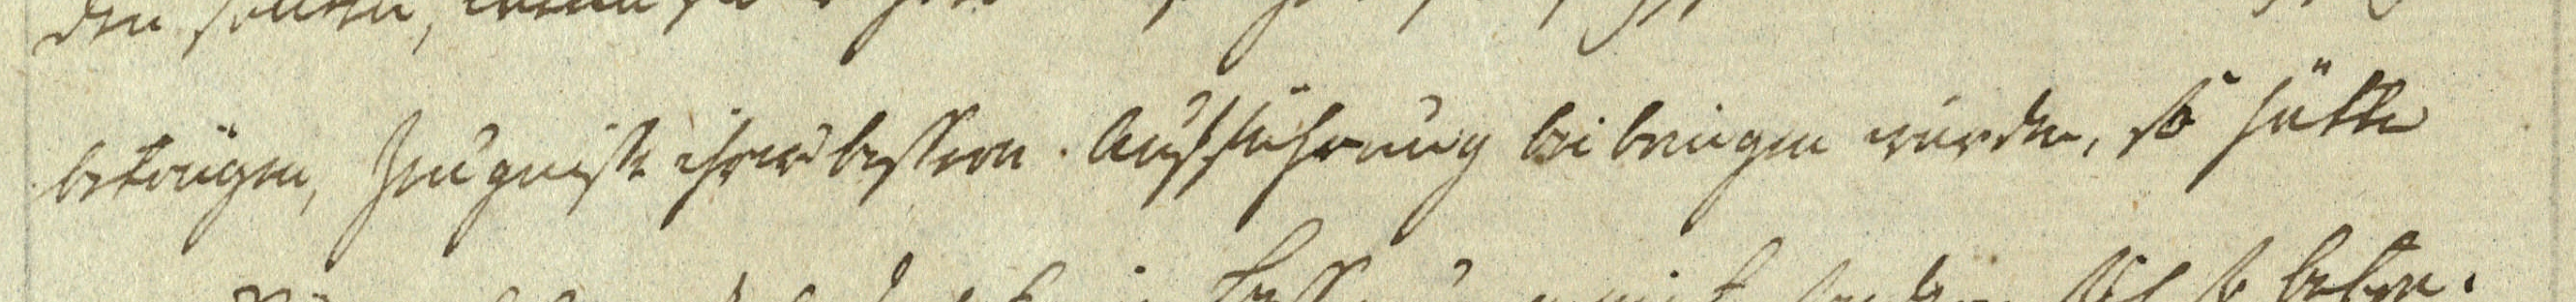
betrügen, Zeugnisse ihrer bessern. Aufführung beibringen würden, so hätte
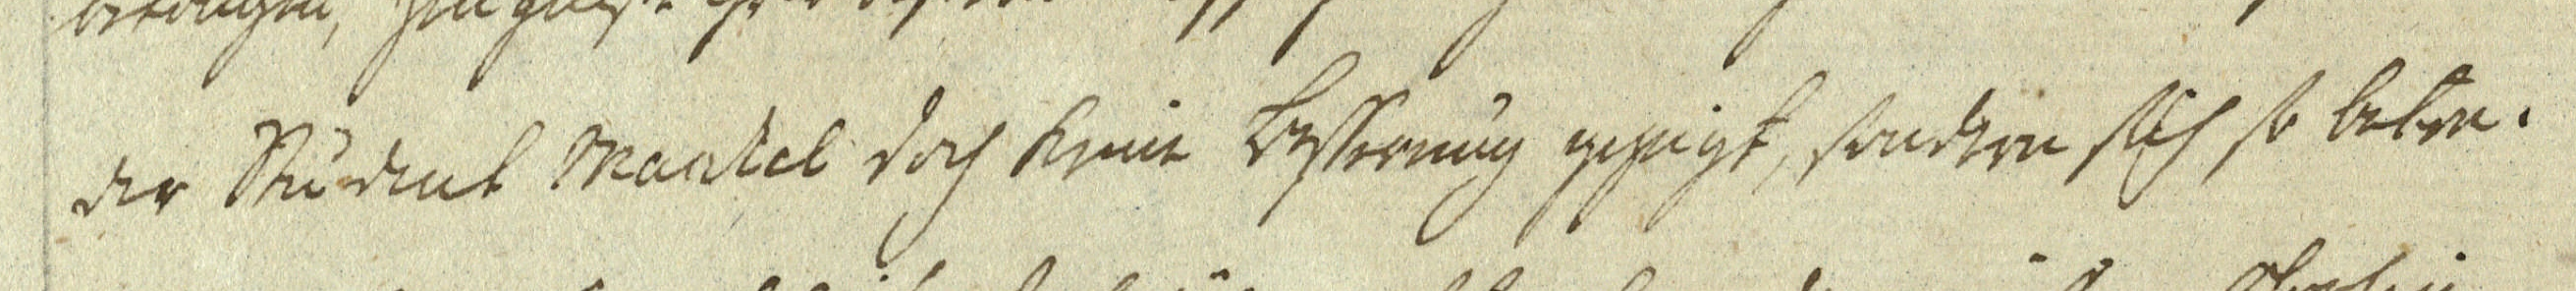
der Student Manzel doch keine Besserung gezeigt, sondern sich so betra¬
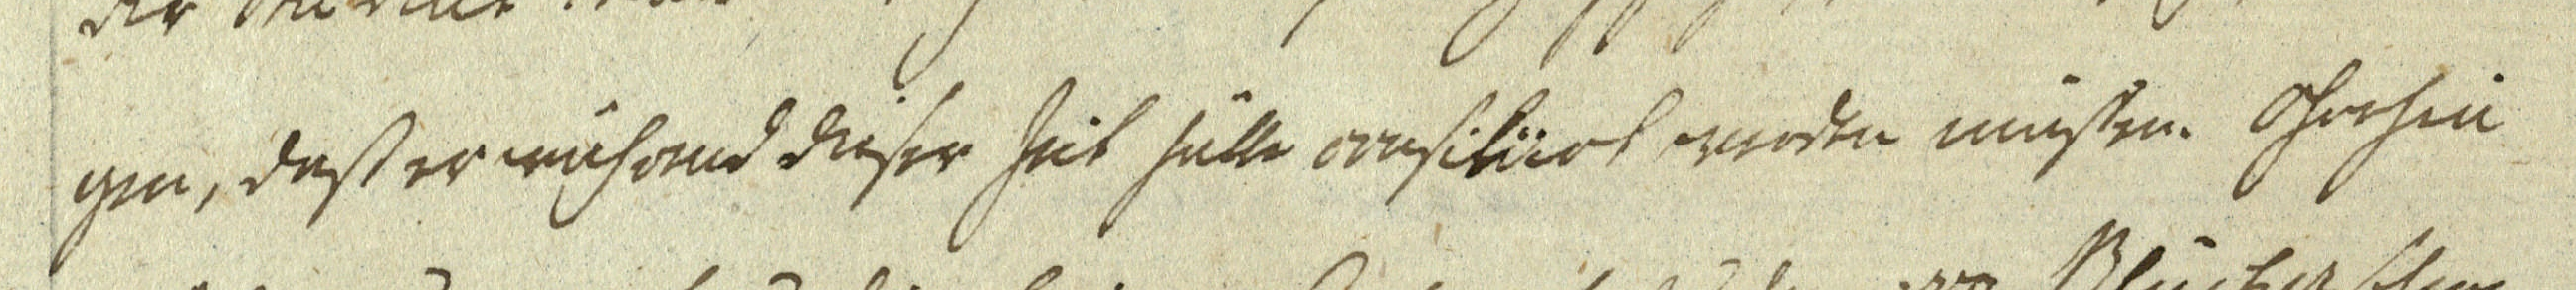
gen, daß er während dieser Zeit hätte cosiliirt werden müssen. Ohnehin
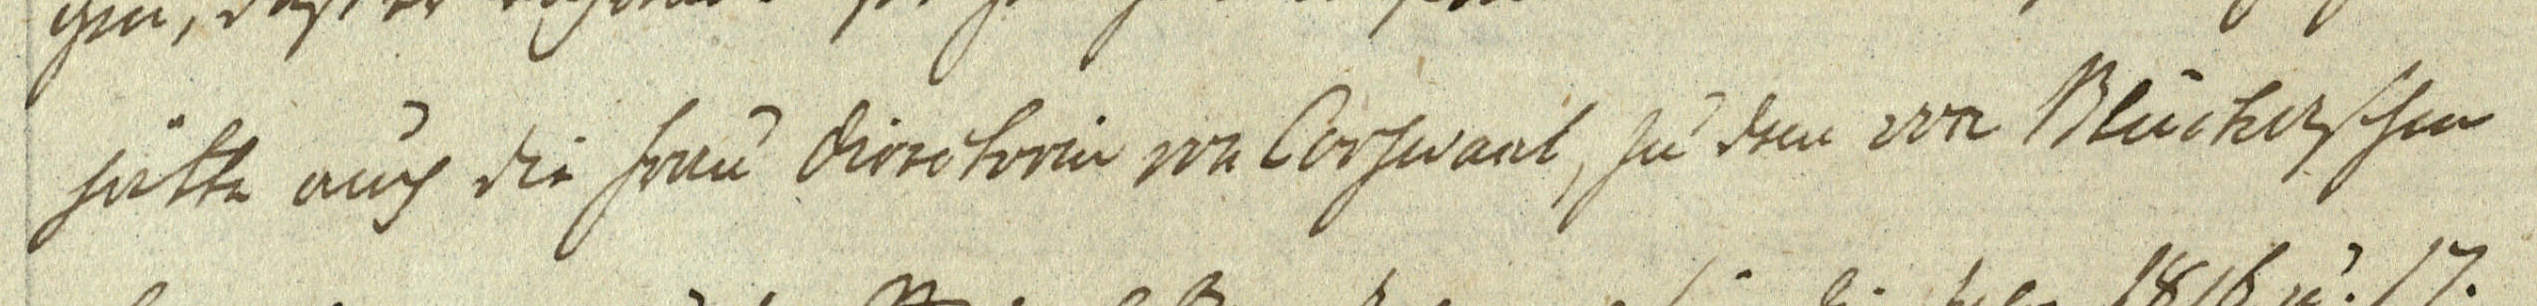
hätte auch die Frau Directorin von Corswant, zu dem von Blücherschen
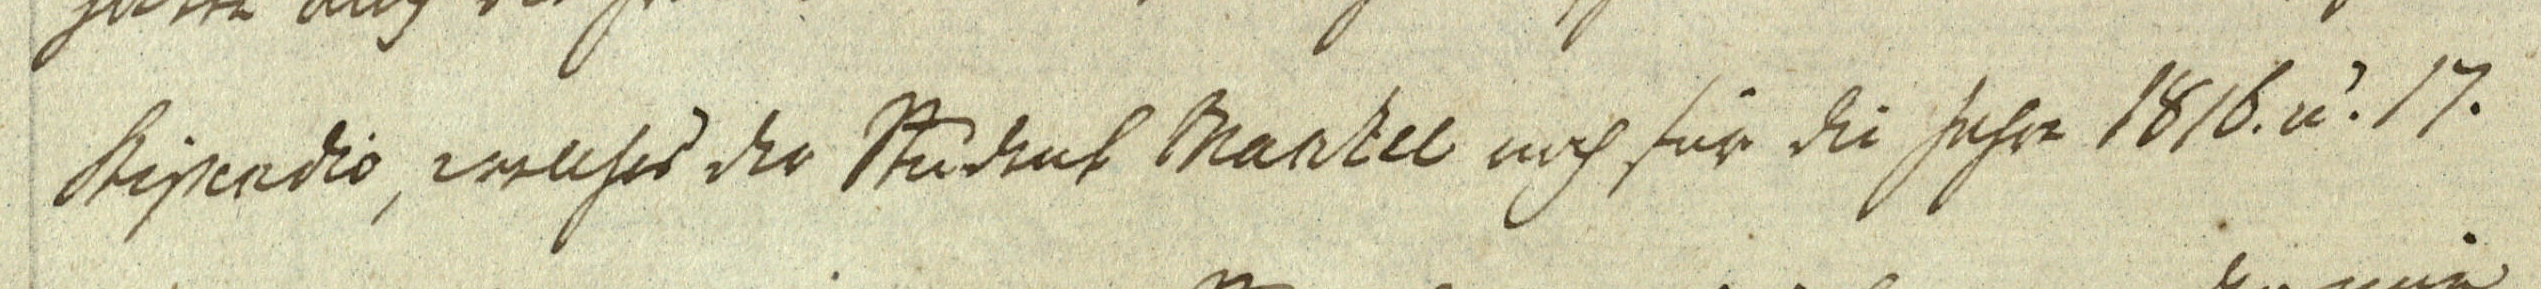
Stipendio, welches der Student Manzel noch für die Jahre1816. u. 17.
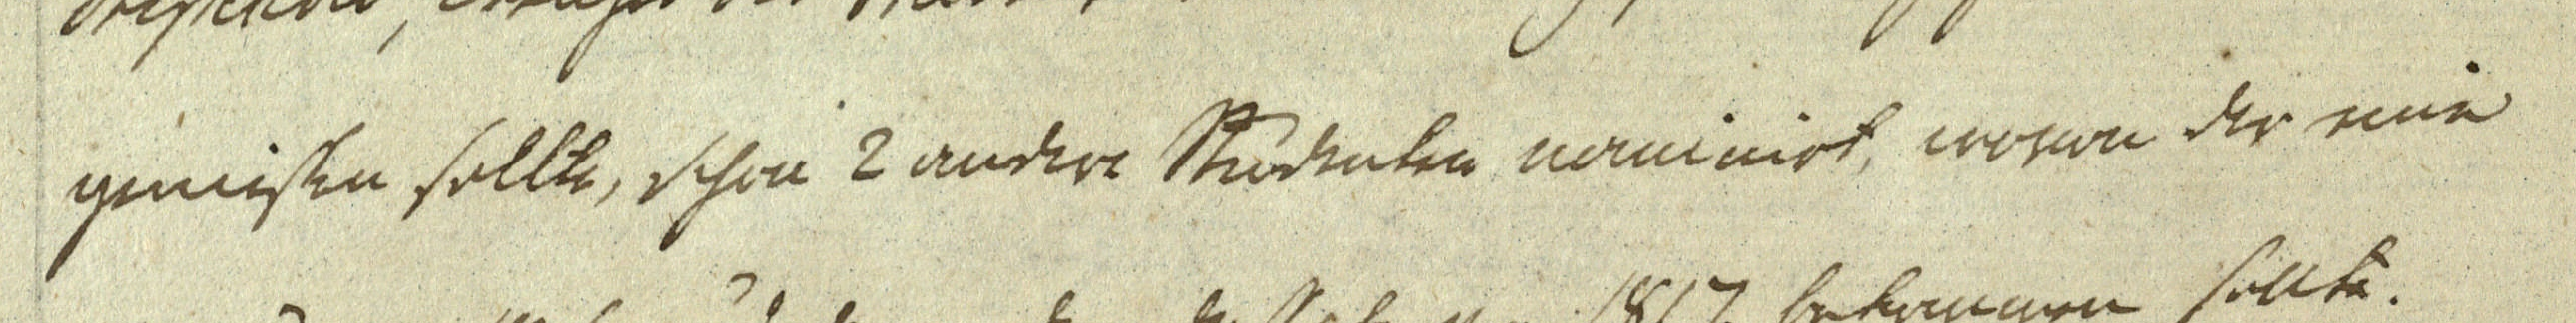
geniessen sollte, schon 2 andere Studenten nominirt, wovon der eine
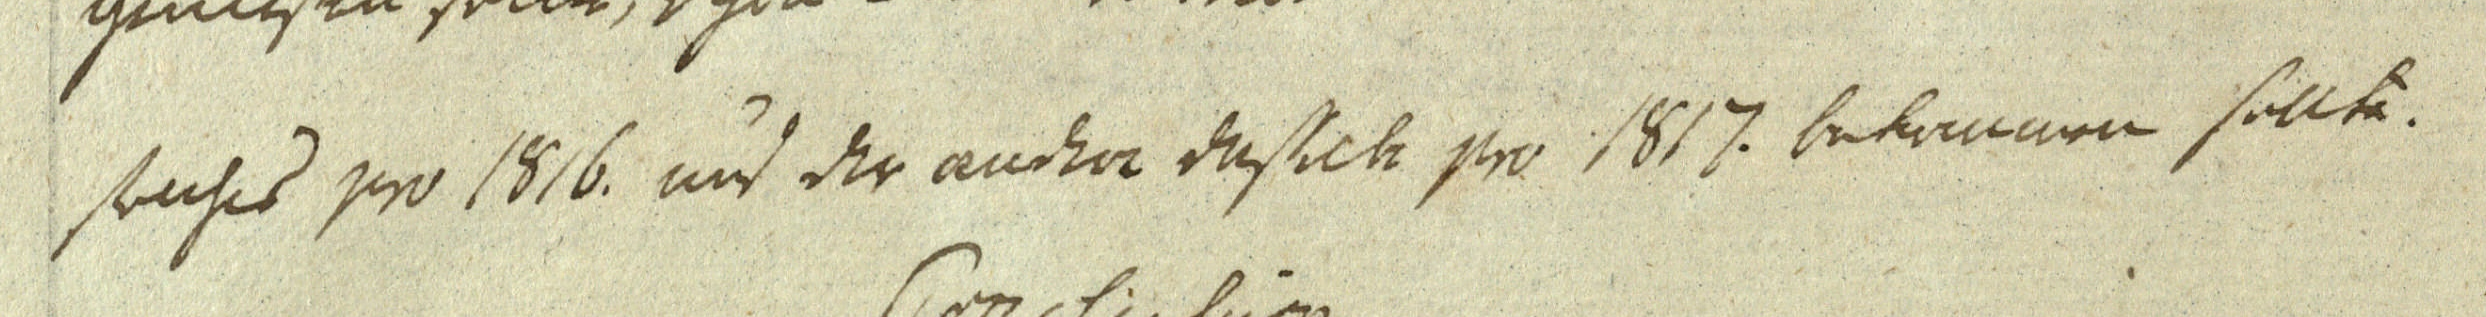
solches pro 1816. und der andere dasselbe pro 1817. bekommen sollte.
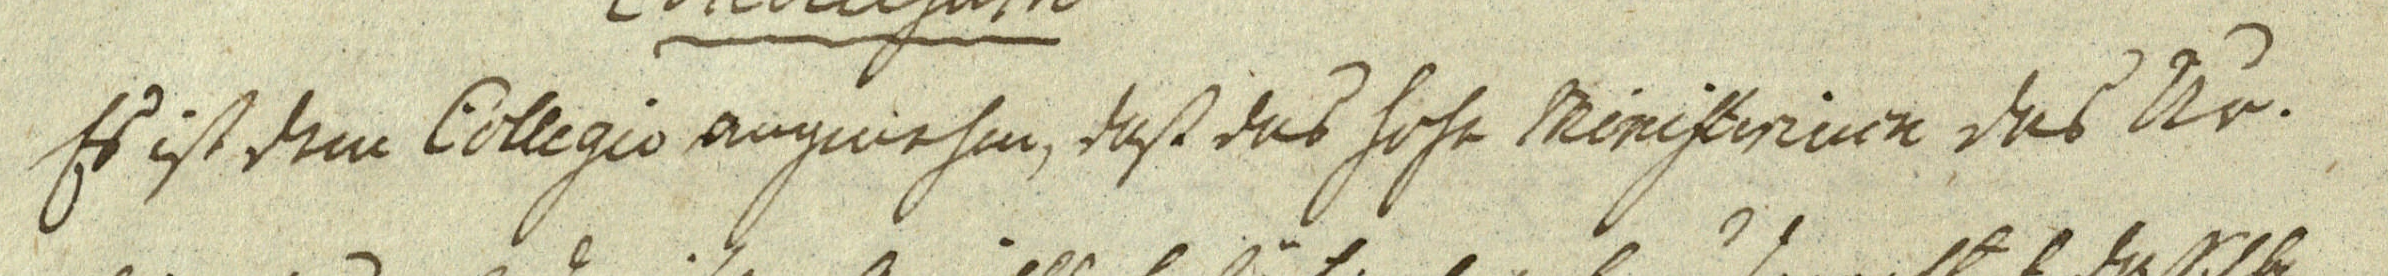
Es ist dem Collegio angenehm, daß das hohe Ministerium das Ur¬
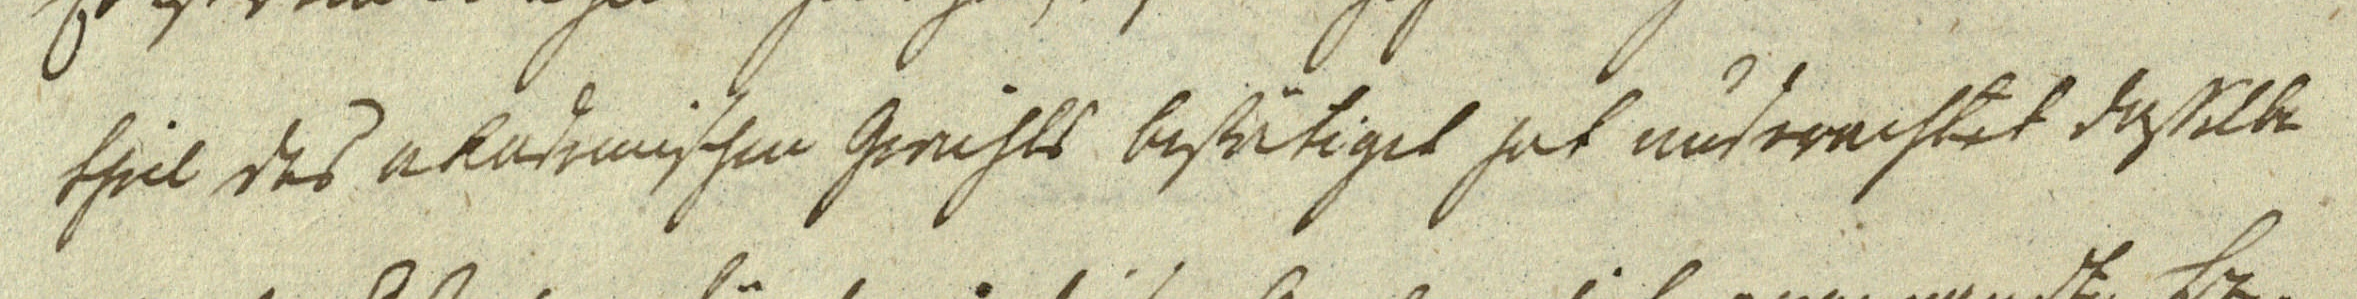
theil des akademischen Gerichts bestätiget hat und erachtet dasselbe
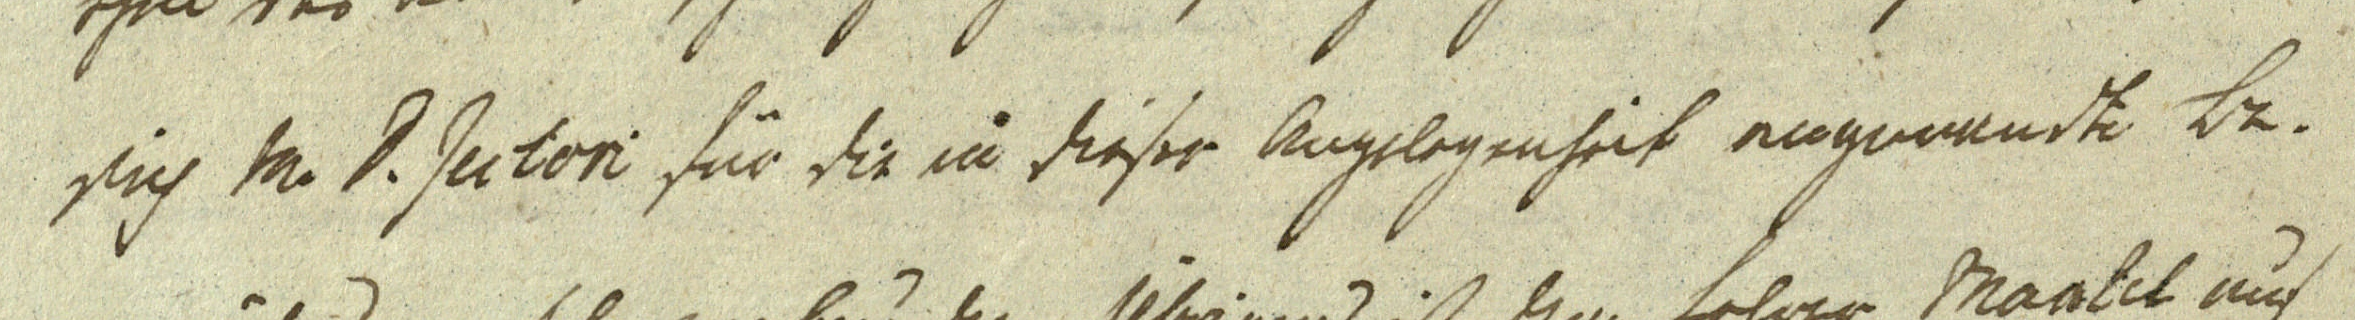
sich M. D. Rectori für die in dieser Angelegenheit angewandte Be¬
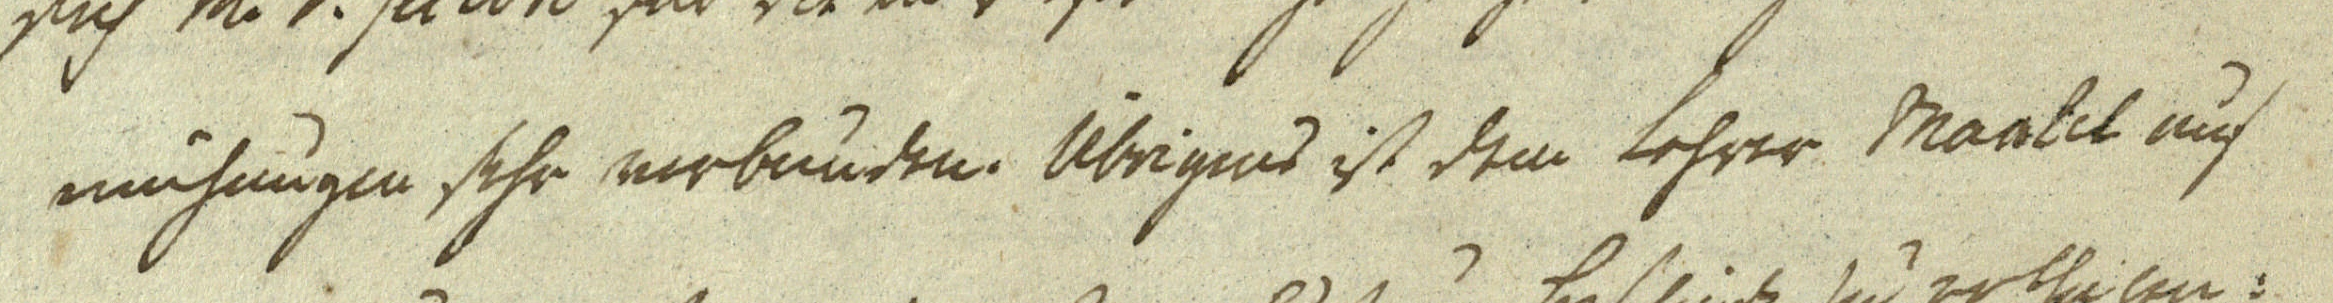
mühungen sehr verbunden. Übrigens ist dem Lehrer Manzel auf
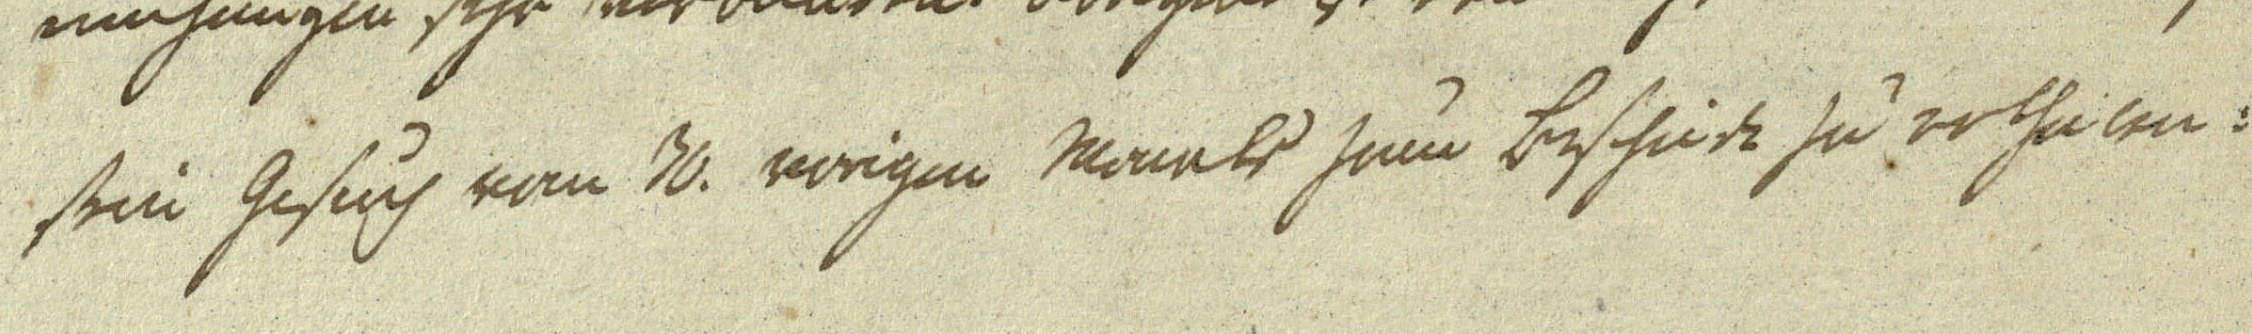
sein Gesuch vom 30. vorigen Monats zum Bescheide zu ertheilen:
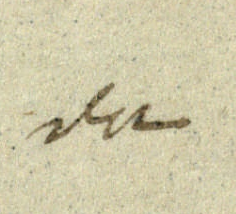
da
